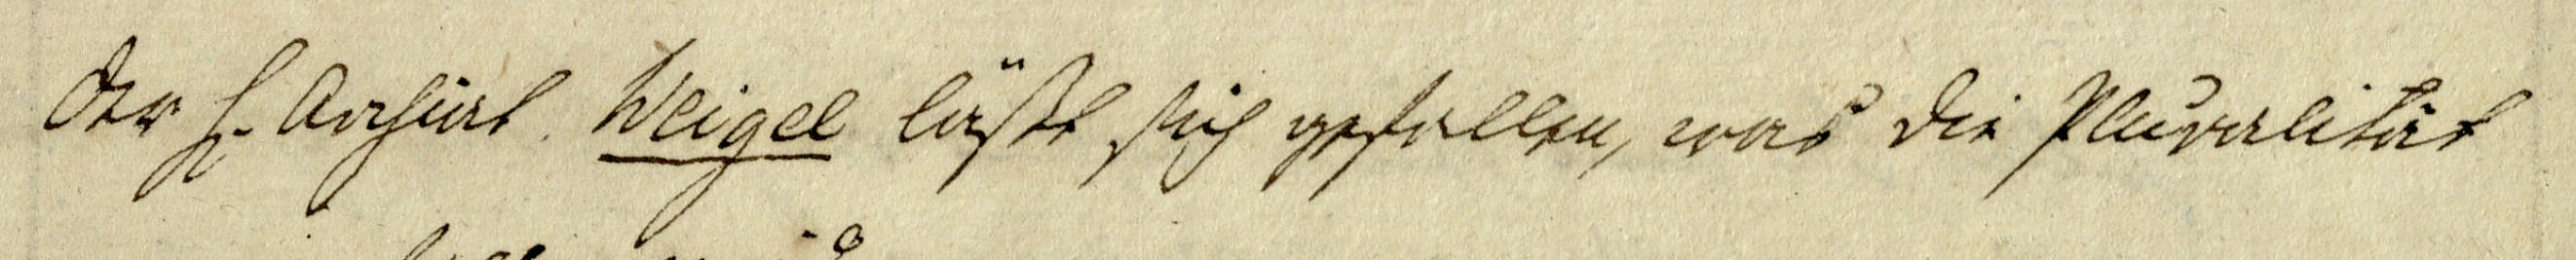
Der h. Archiat. Weigel läßt sich gefallen, was die Pluralität
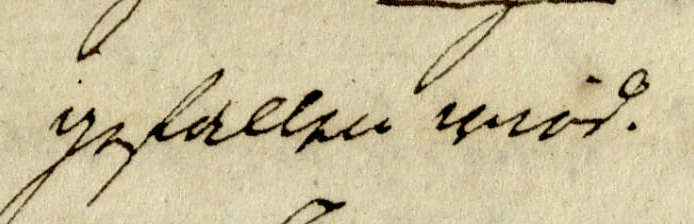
gefallen wird.
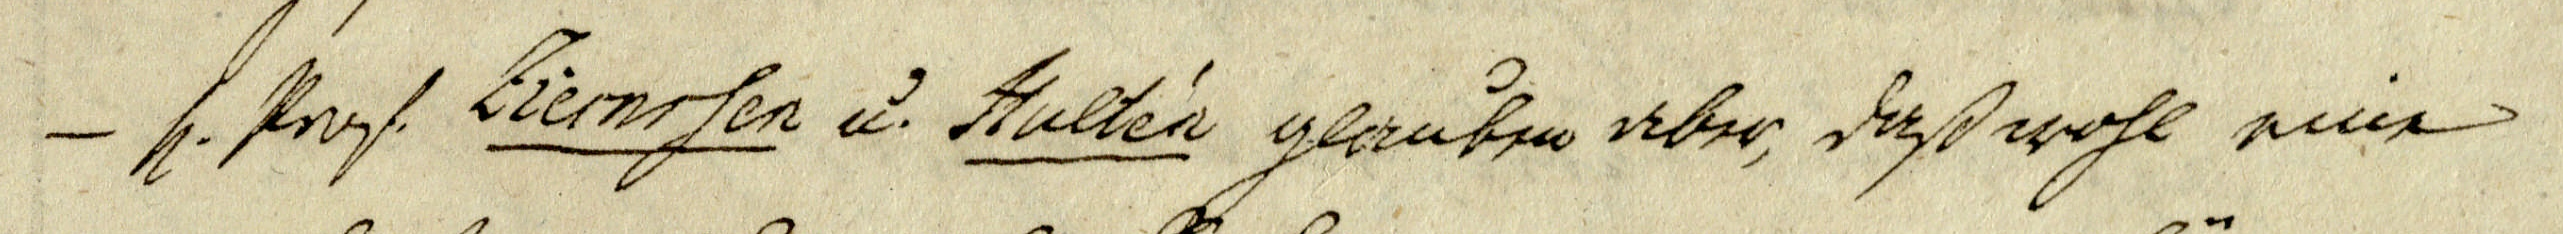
dh. Prof. Ziemssen u. Hultén glauben aber, daß wohl eine
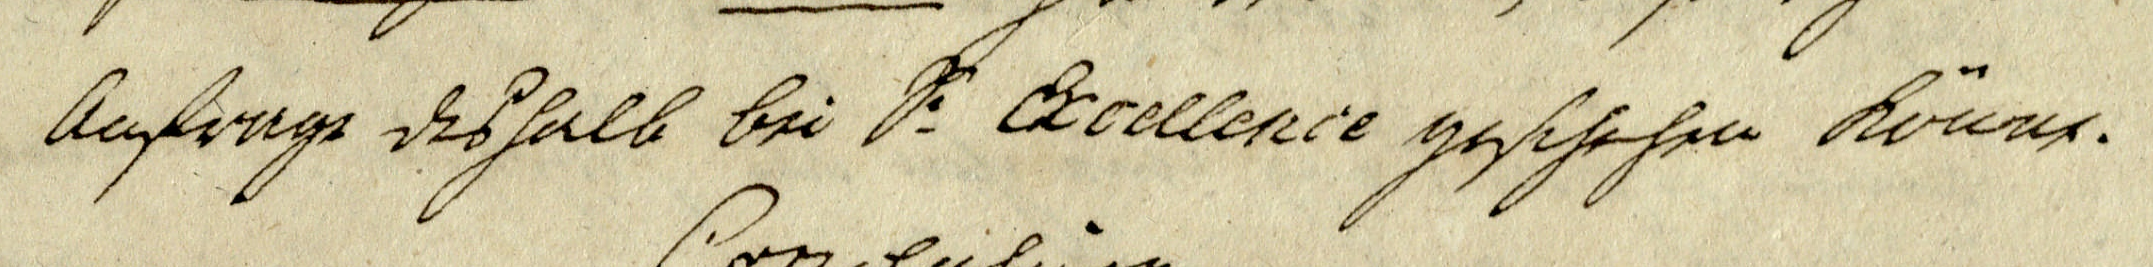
Anfrage deshalb bei Sr. Excellence geschehen könne.
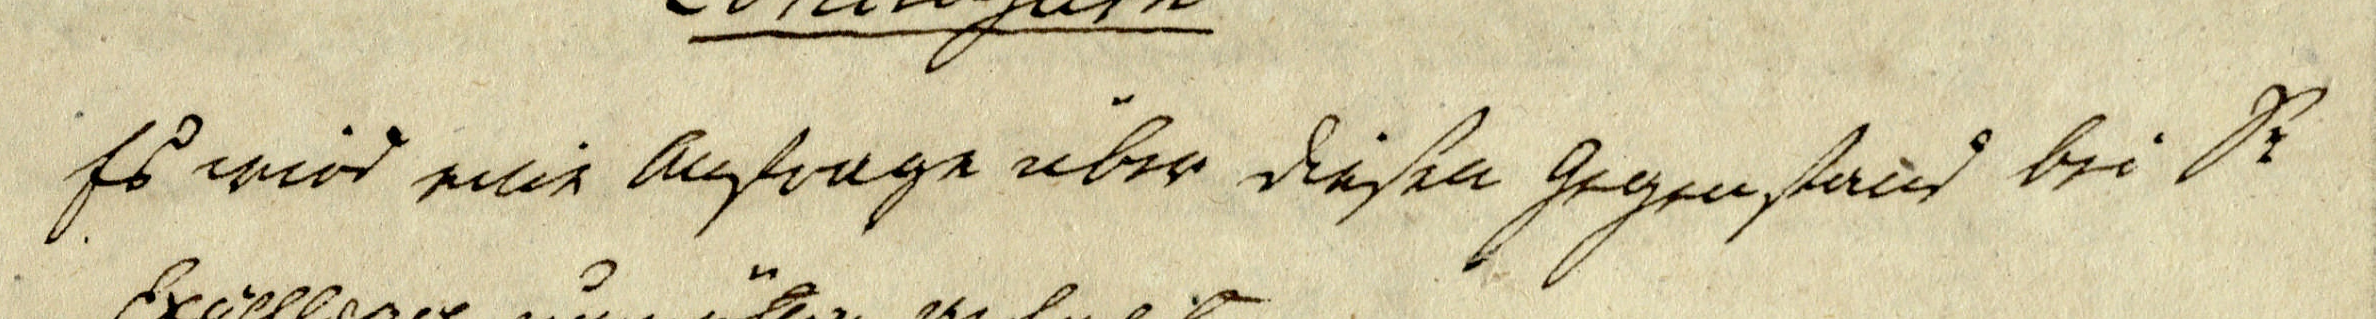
Es wird eine Anfrage über diesen Gegenstand bei Sr.
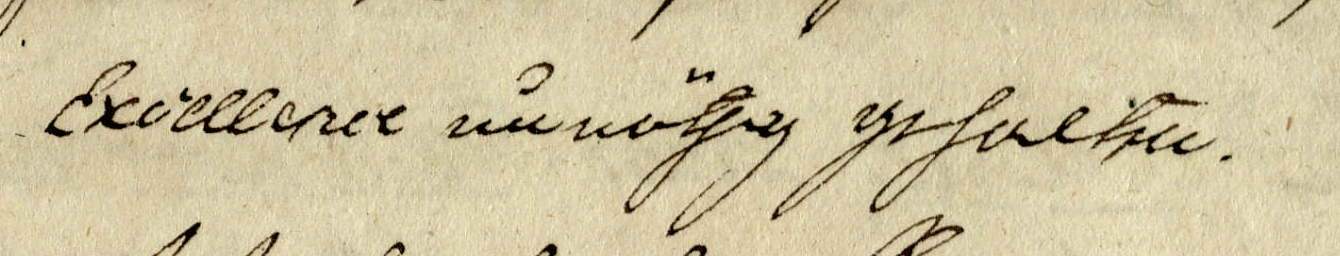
Excellence unnöthig gehalten.
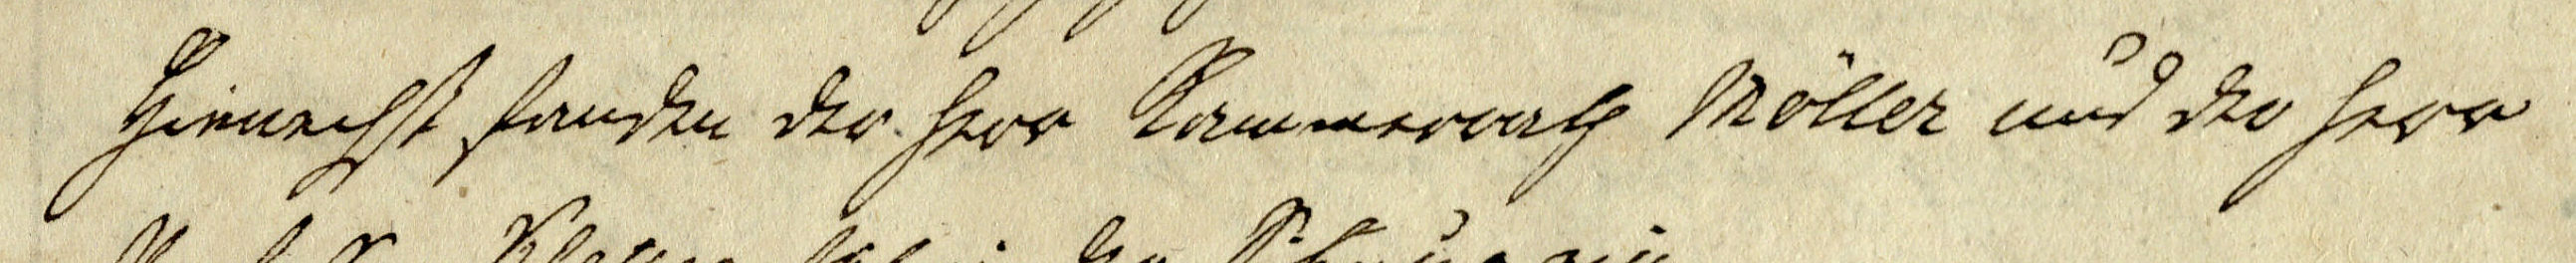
Hienechst fanden der Herr Kammerrath Möller und der Herr
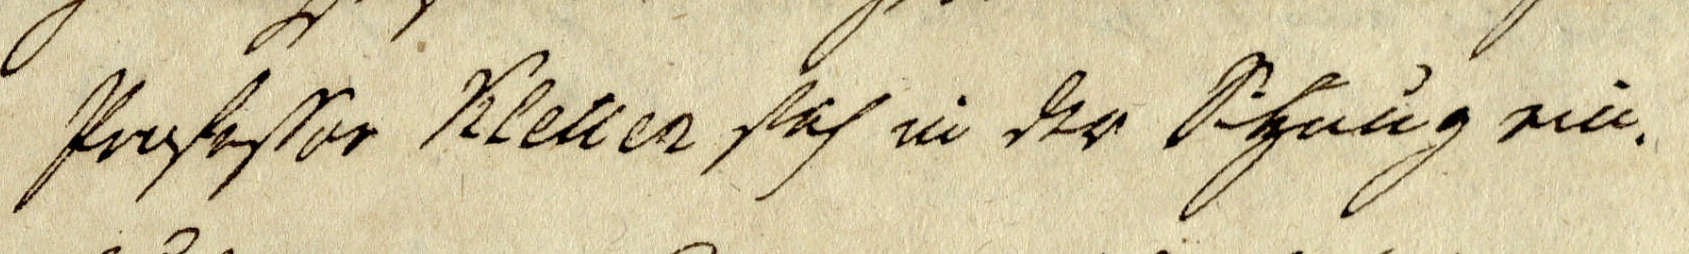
Professor Kletten sich in der Sitzung ein.
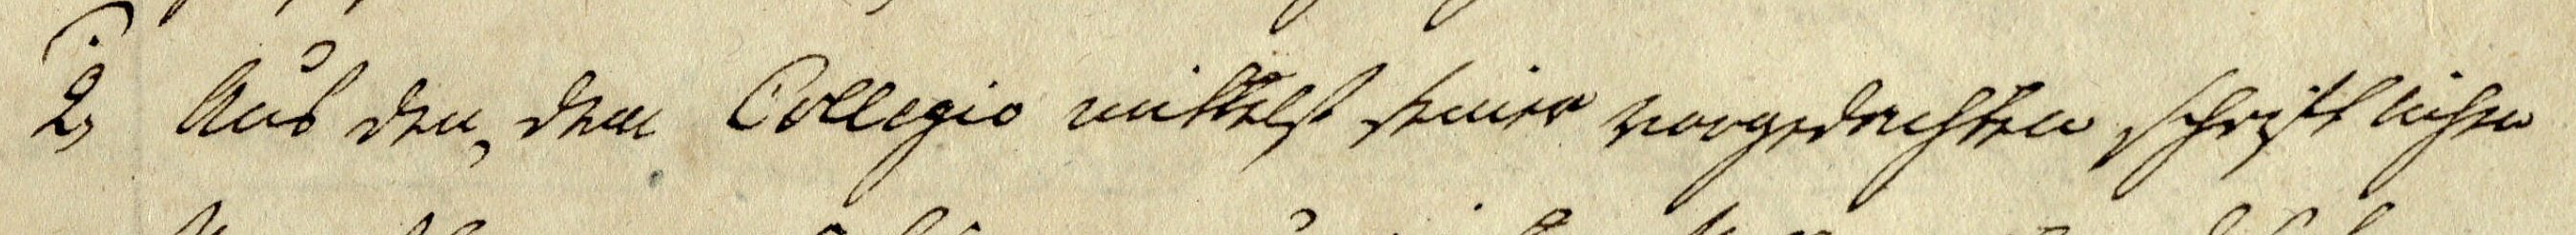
2, Aus den, dem Collegio mittelst seiner vorgedachten schriftlichen
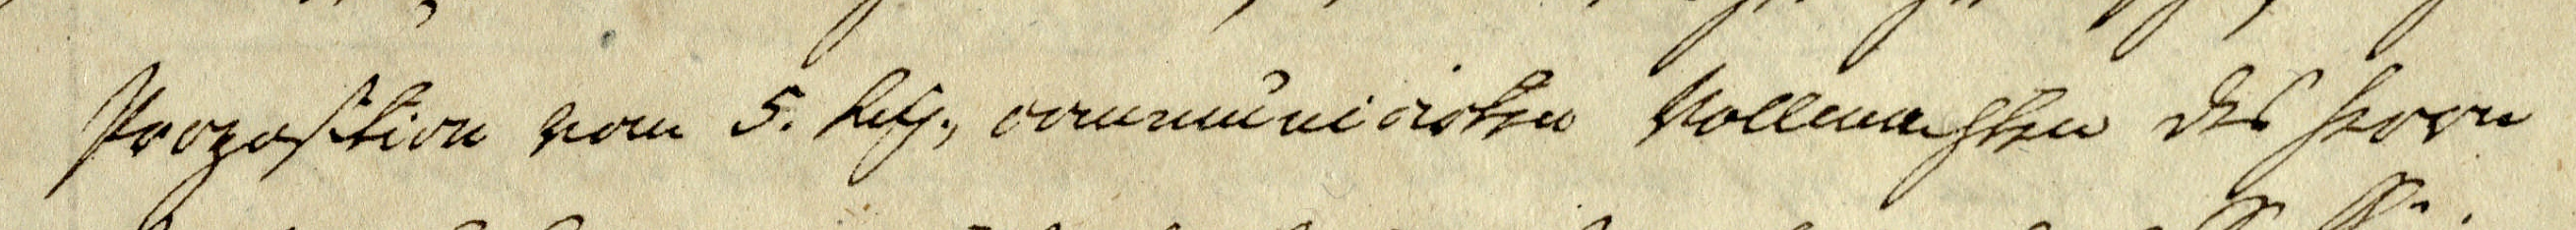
Proposition vom 5. huj., communicirten Vollmachten des Herrn
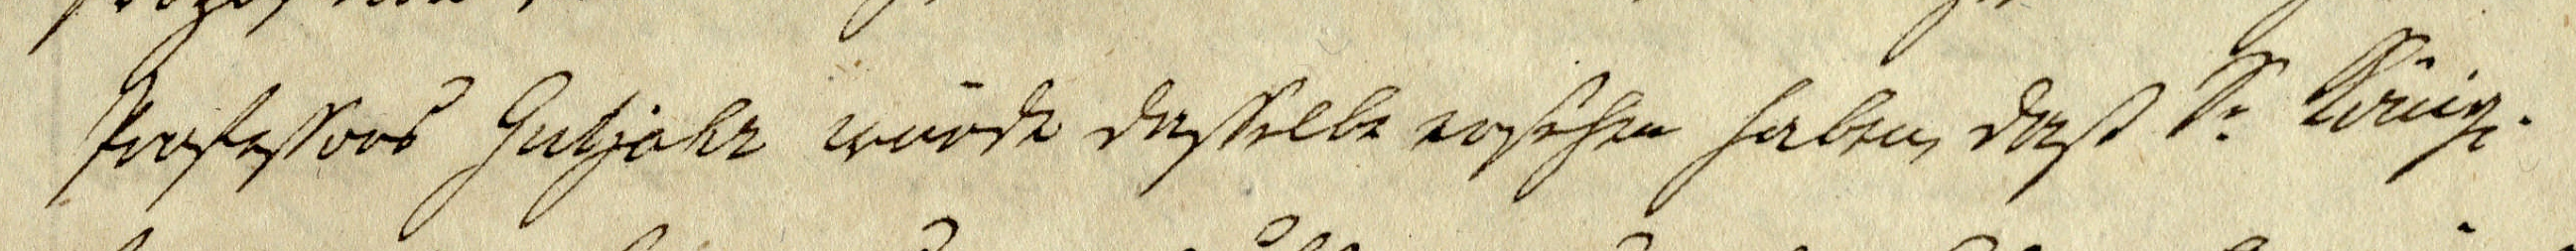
Professors Gutjahr würde dasselbe ersehen haben, daß Sr. König.
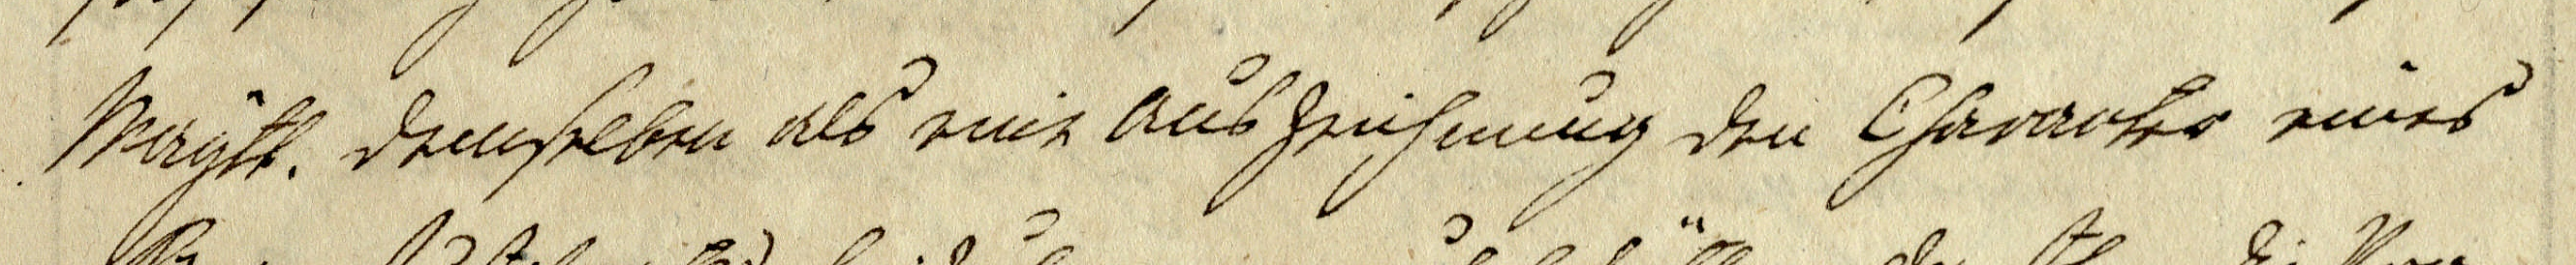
Maÿtt. demselben als eine Auszeichnung den Character eines
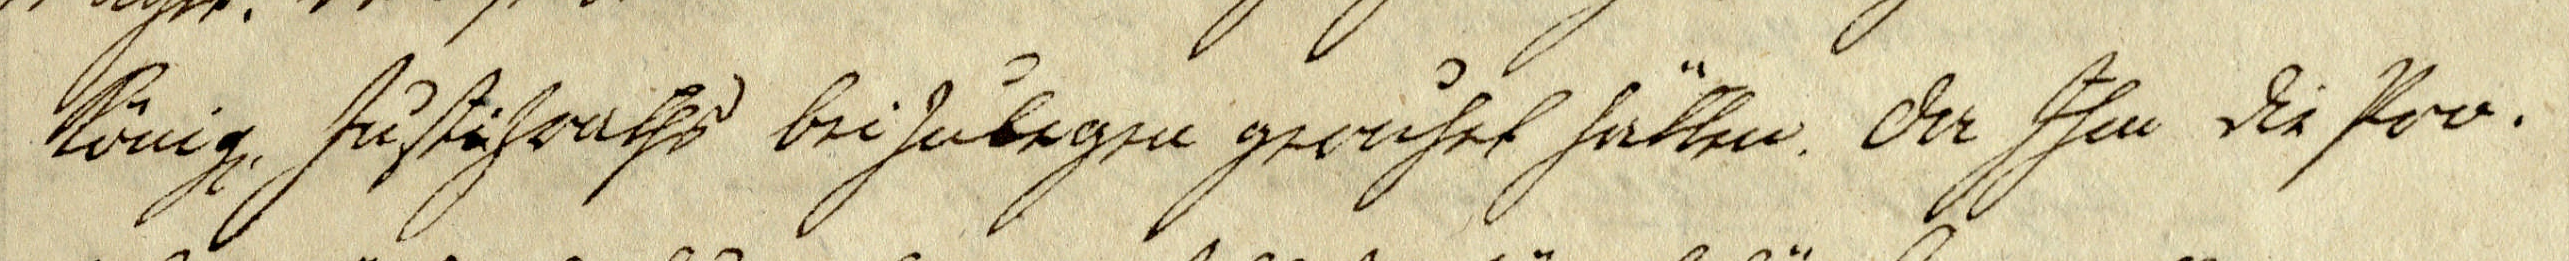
König. Justizraths beizulegen geruhet hätten. Da Ihm die Pro¬
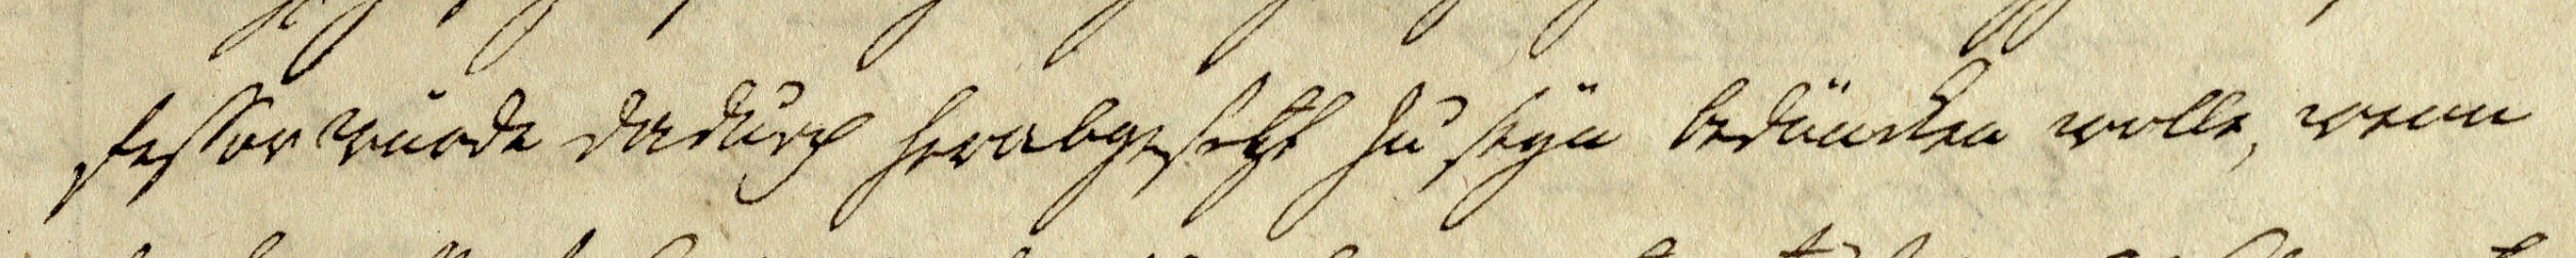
fessorwürde dadurch herabgesetzt zu seÿn bedüncken wolle, wenn
